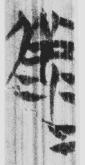備=
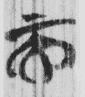而
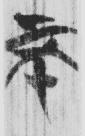不
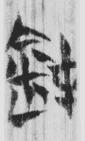釮
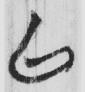㠯（以）
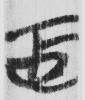𠁩
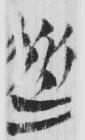從
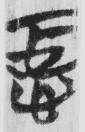忠
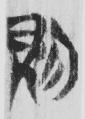則
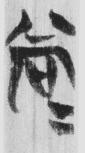尚=
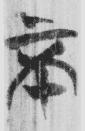不
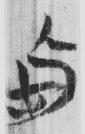{才匕}
